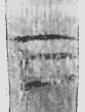三
